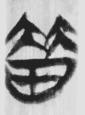昔
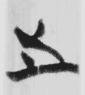之
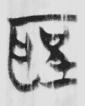聖
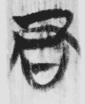君
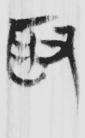取
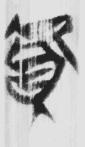{虍貝}
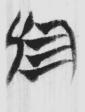於
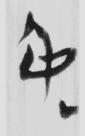身
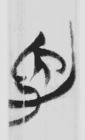勉
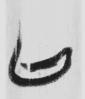㠯（以）
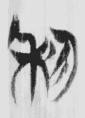利
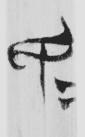民=
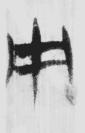用
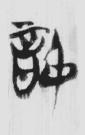{言身}
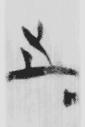之
